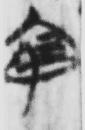竆（躬）
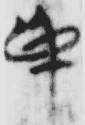身
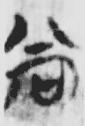尚
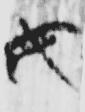母
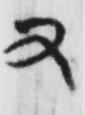又（有）
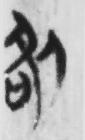咎
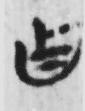占
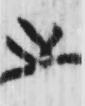之
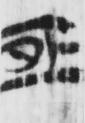亙（恆）
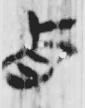貞
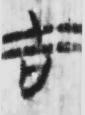吉
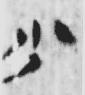少
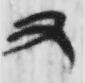又（有）
